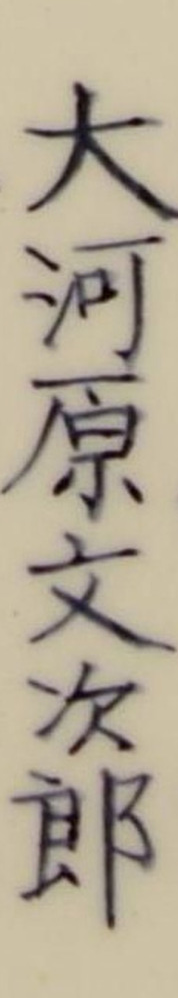大河原文次郎
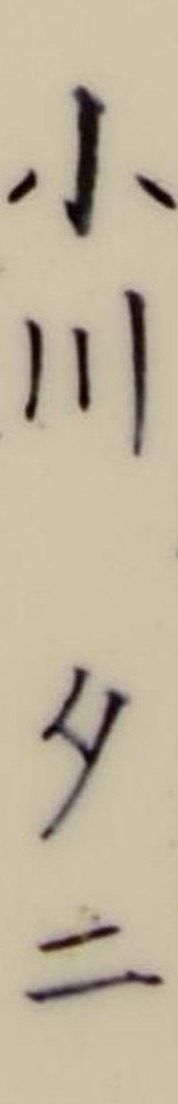小川夕二
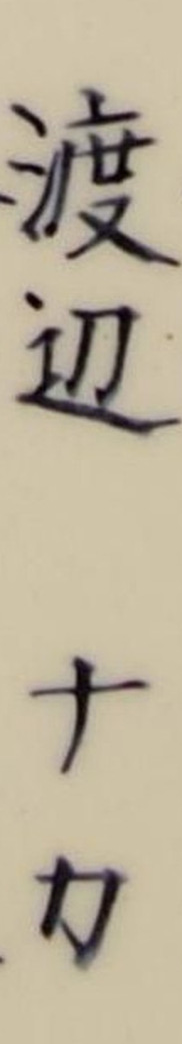渡辺ナカ
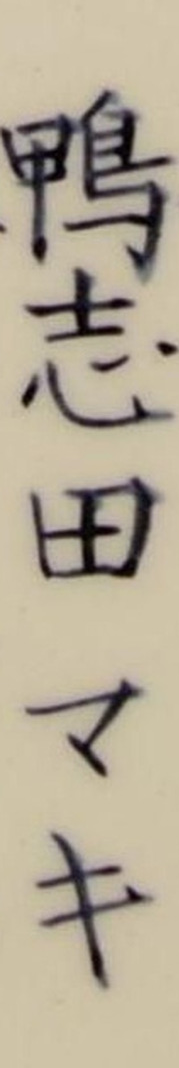鴨志田マキ
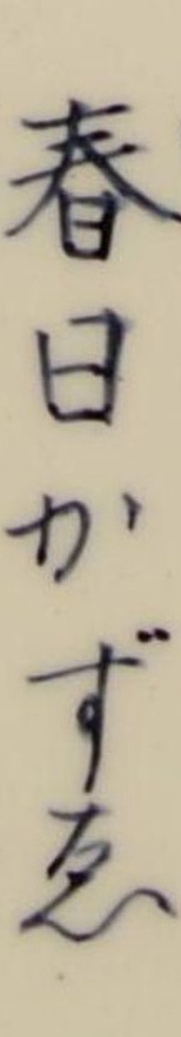春日かずえ
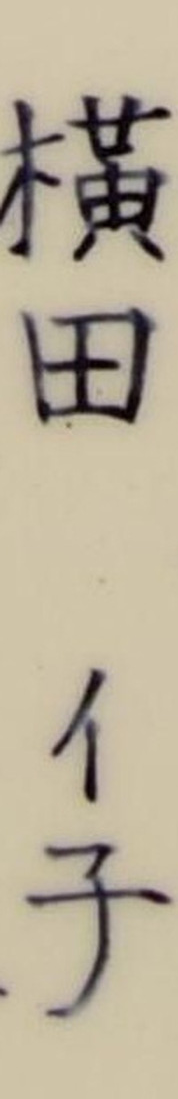横田イ子
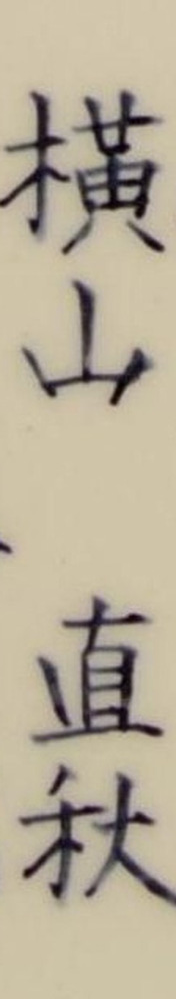横山直秋
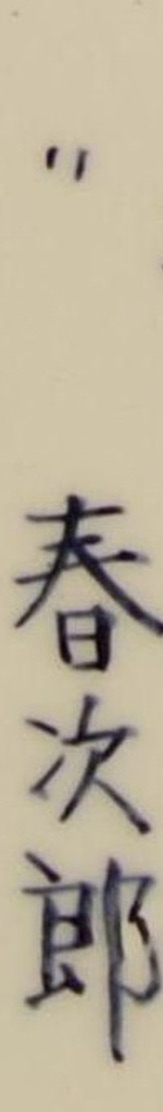春次郎
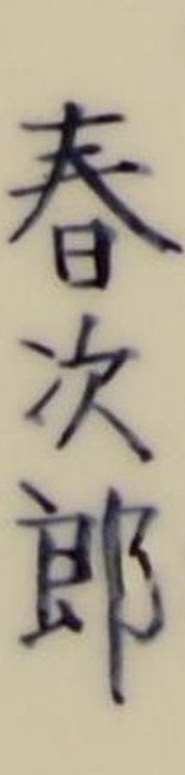春次郎
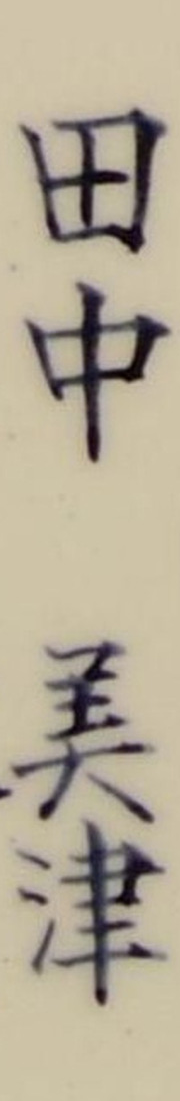田中美津
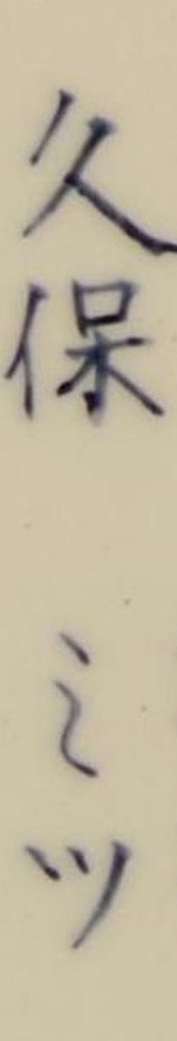久保ミツ
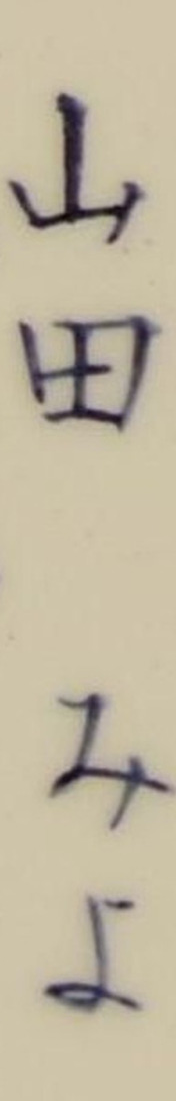山田みよ
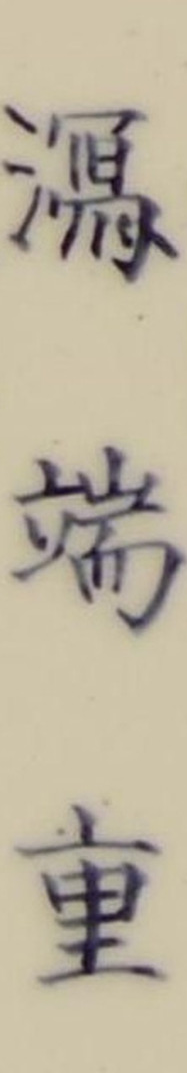瀉端重
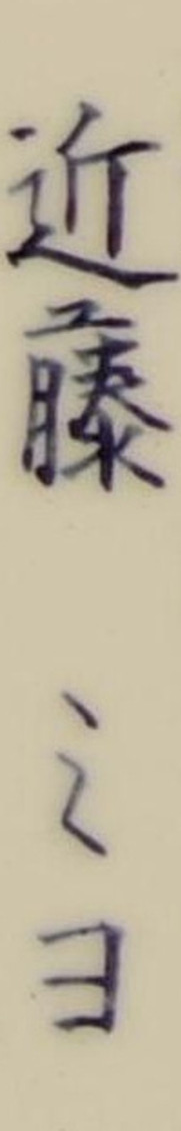近藤ミヨ

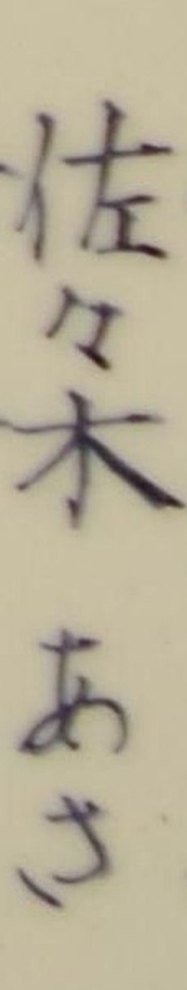佐々木あさ
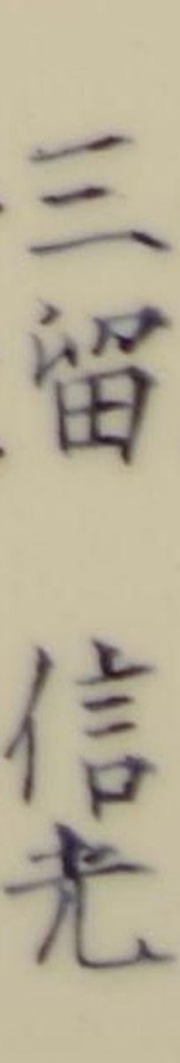三留信光
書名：E~L
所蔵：高野山金剛峯寺
